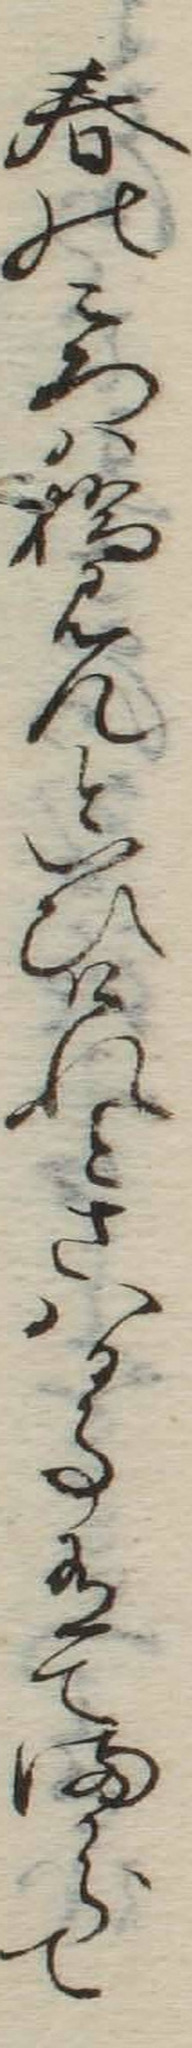春のころ八橋見んといひけれとさはる事有てまからて

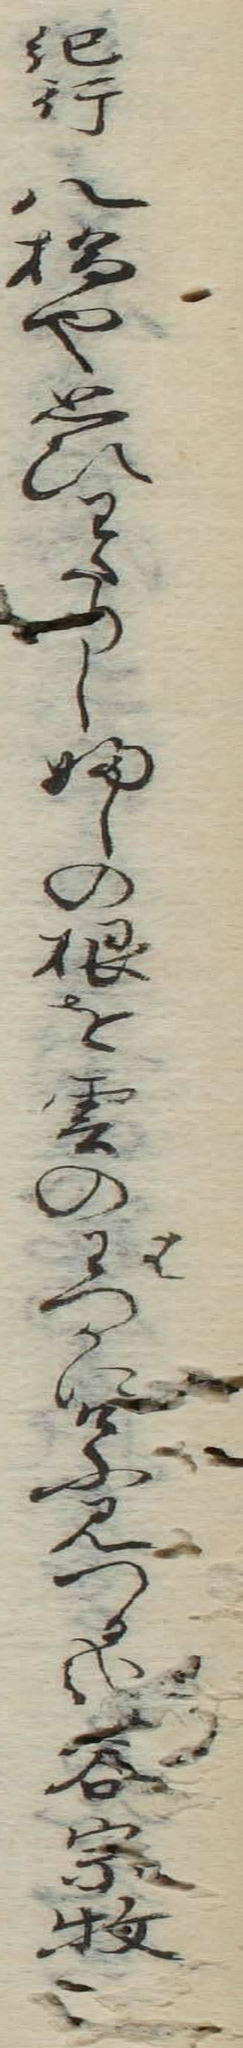紀行八橋や思ひわたりしふしの根を雲のわつかにけふ見つる哉谷宗牧
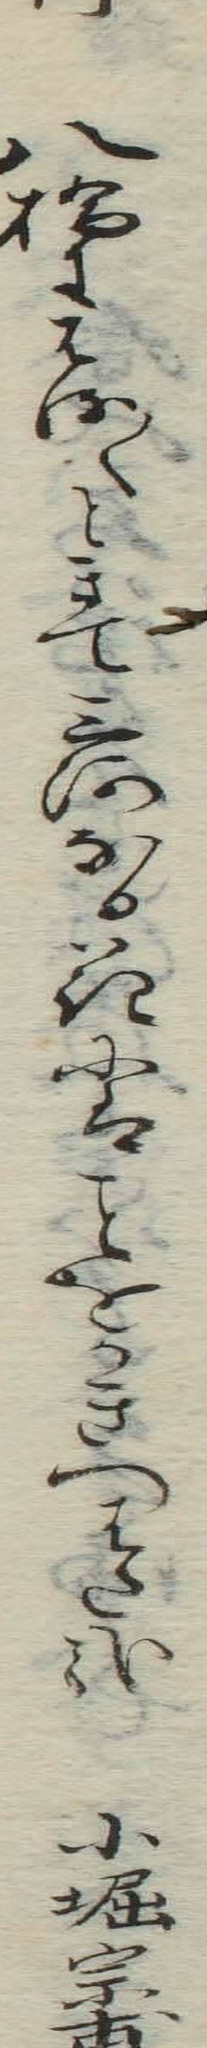同八橋にはる〳〵とまて三河なる花にはことをかきつはた哉小堀宗甫
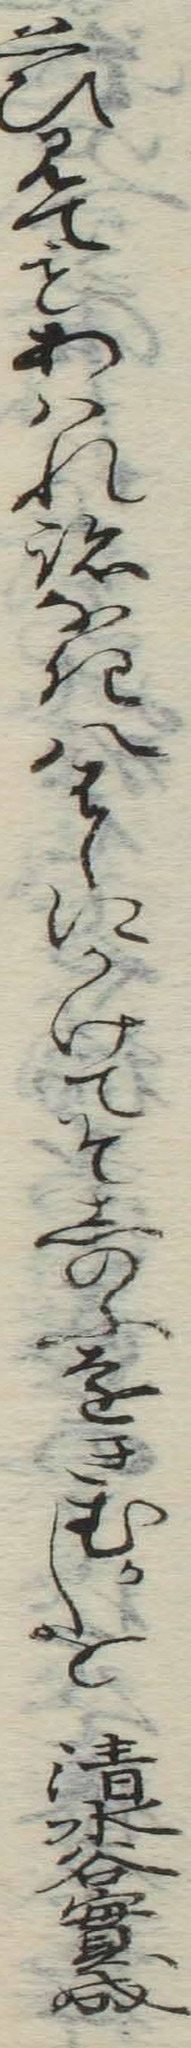思ひ見てもあはれ跡なき八はしにかけてそしのふ遠きむかしを清水谷実成
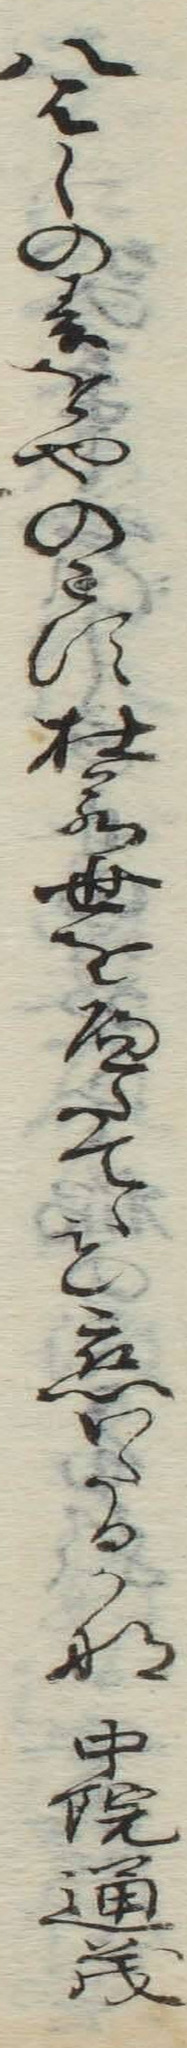八はしの春をやのこす杜若世をへたてゝも恋わたるかな中院通茂
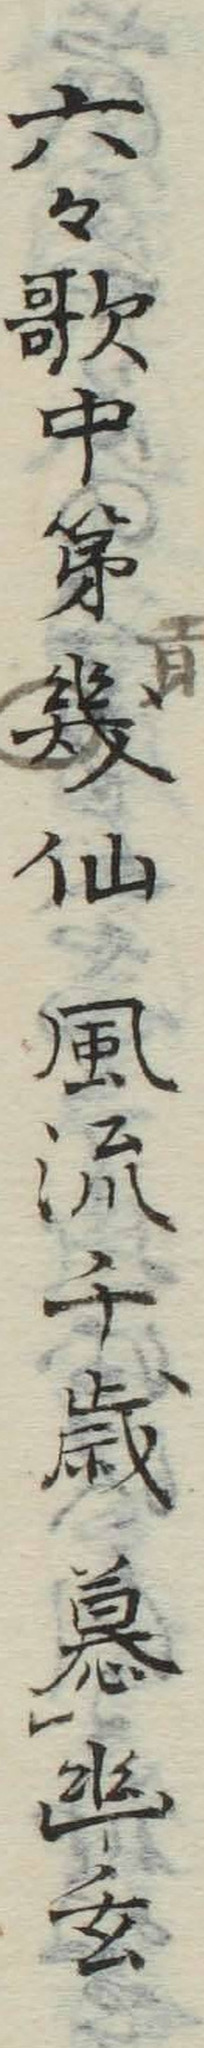六々歌中第貳仙風流千歳慕幽-玄
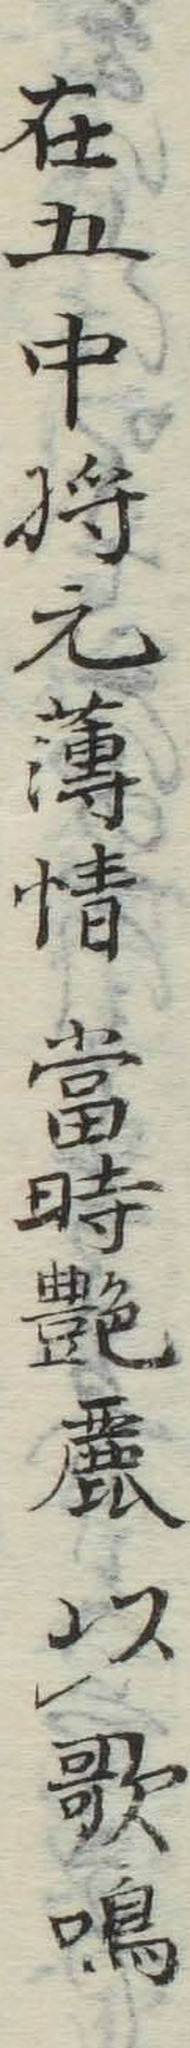在五中将元薄情当時艶麗以歌鳴
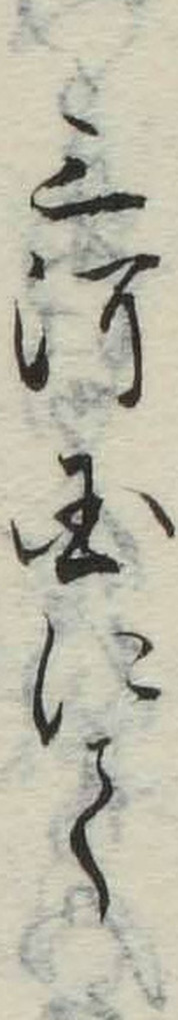三河国にて
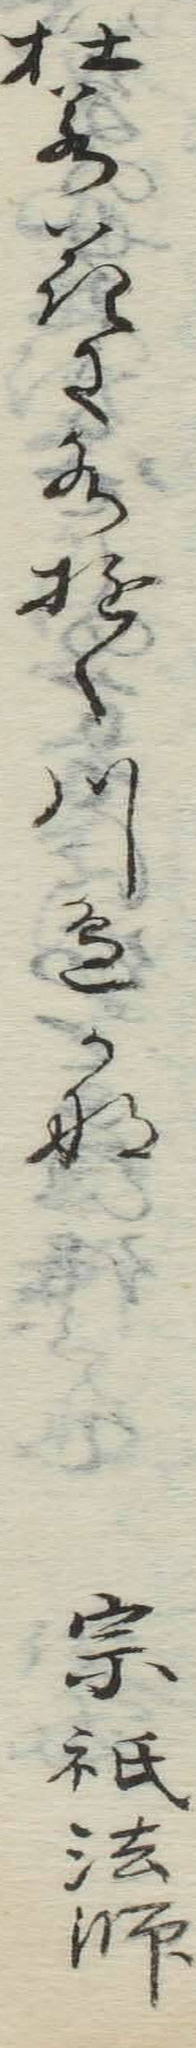杜若花に水ゆく川辺かな宗祇法師
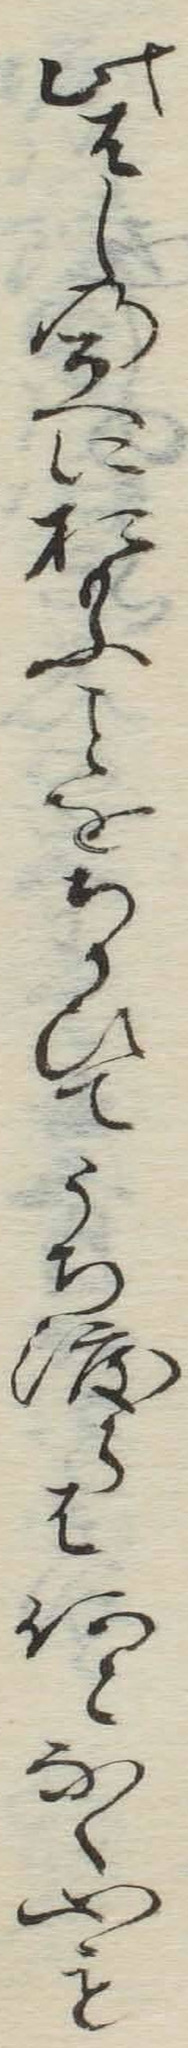此はしのうへにおもふことをちかひてうち渡らは何となく山も
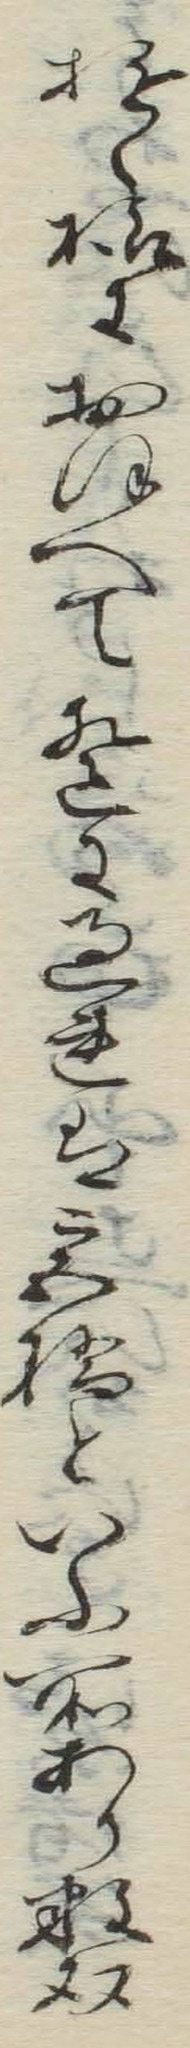ゆく様におほへて遙に過れは宮橋といふ所あり数双
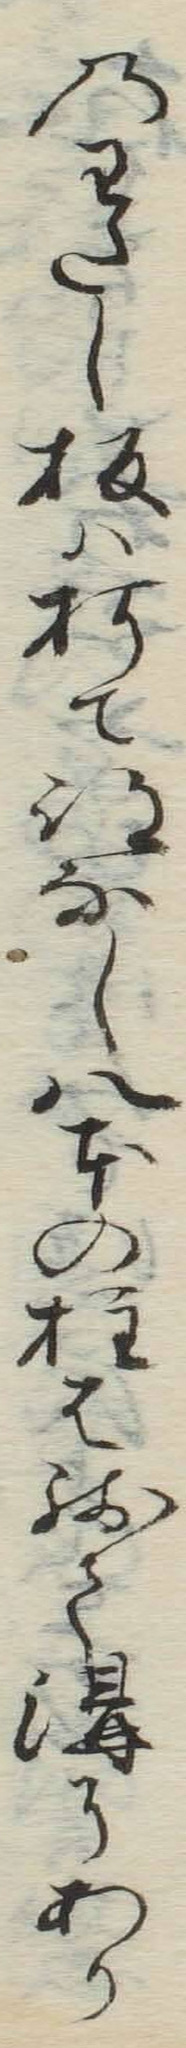のわたし板は朽て跡なし八本の柱は残て溝にあり
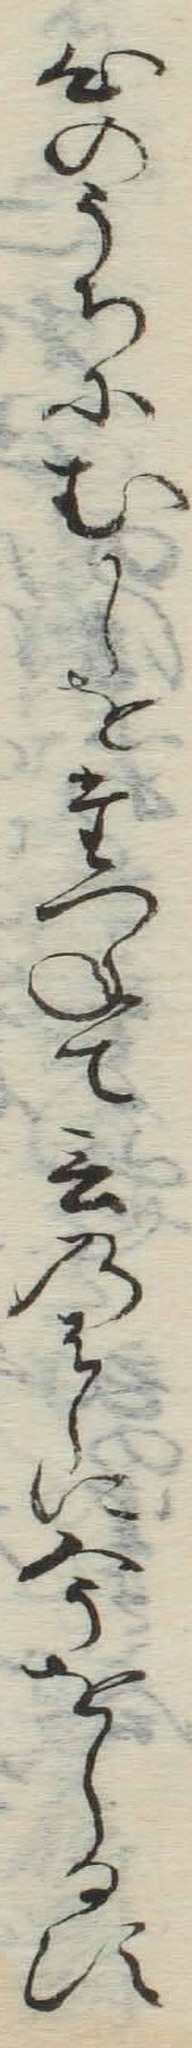心のうちにむかしをたつねて言のはしに今をしるす
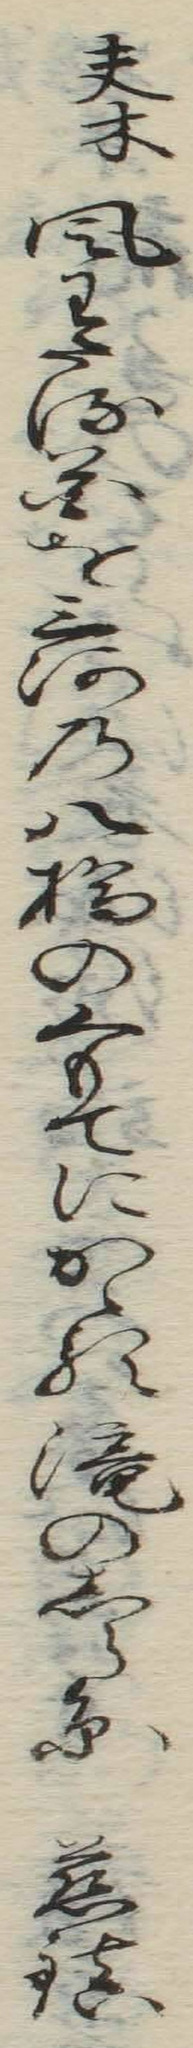夫木風わたる花を三河の八橋のくもてにかゝる滝のしら糸慈鎮

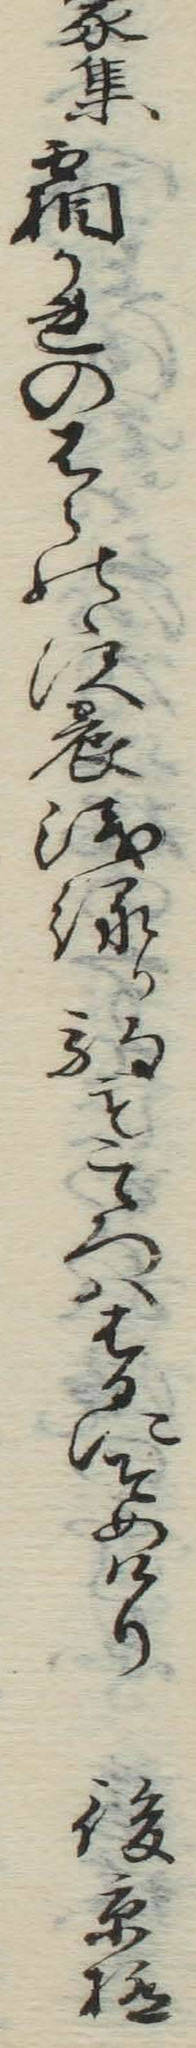家集霜かれのはらのゝ沢の浅緑駒もこゝろははるにそめけり後京極
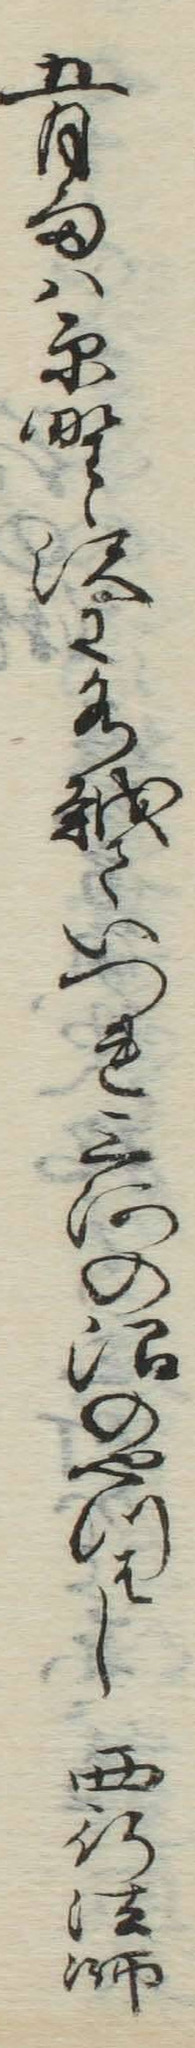五月雨は原野ゝ沢に水越ていつれ三河の沼のやつはし西行法師
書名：三河国二葉松
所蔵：国文学研究資料館
